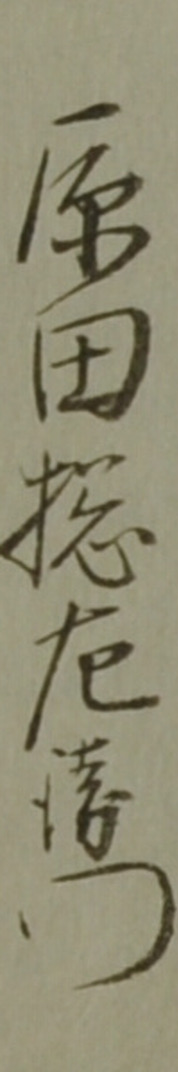原田総左衛門
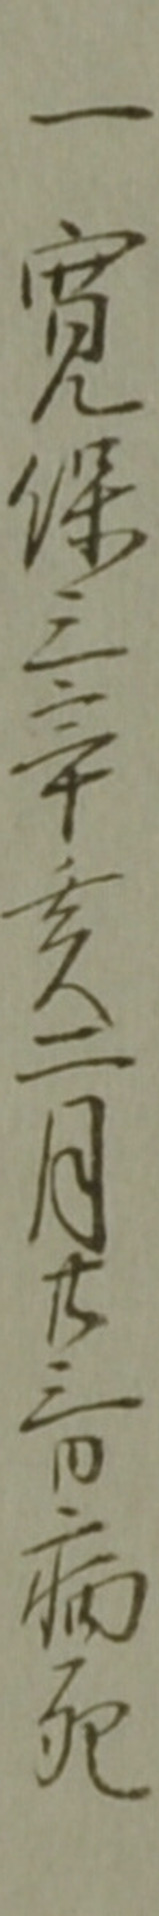一寛保三辛亥二月廿三日病死
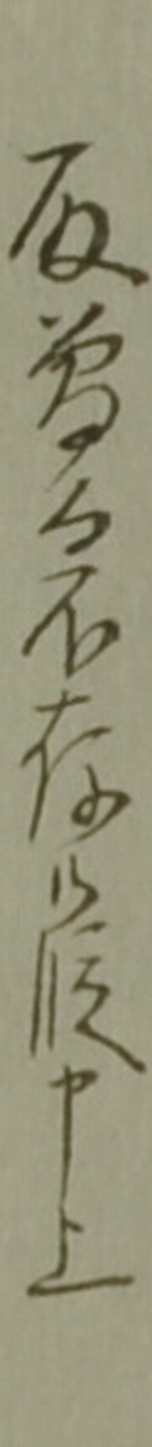取曽而不存候段申上
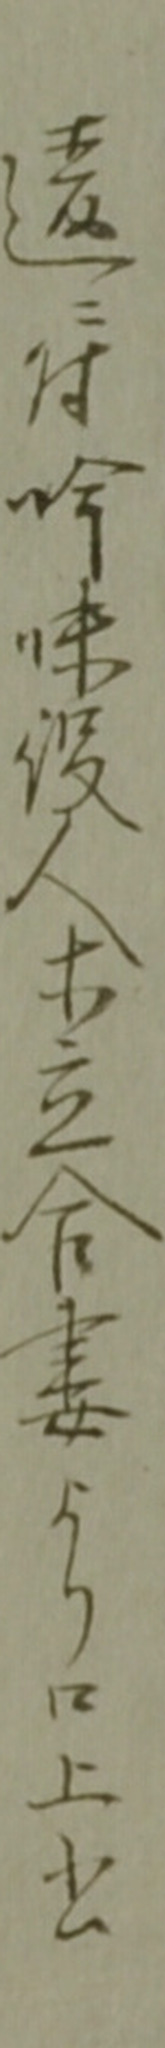違付吟味役人等立合妻より口上書
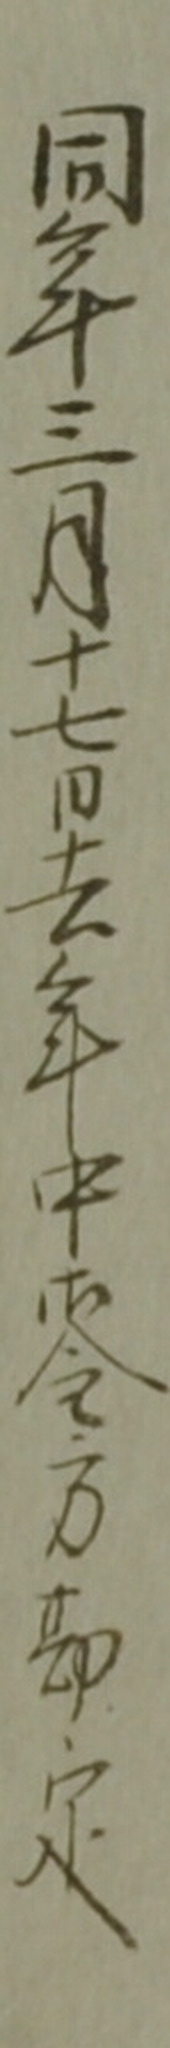同年三月十七日去年中御金方勘定
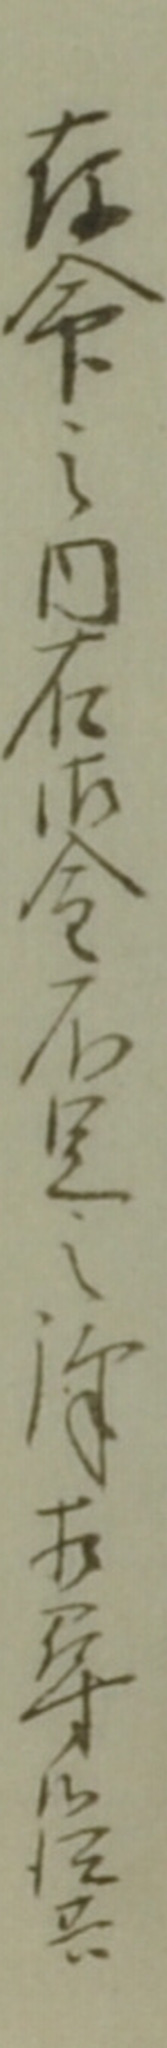存命之内右御金不足之沢相尋候得共
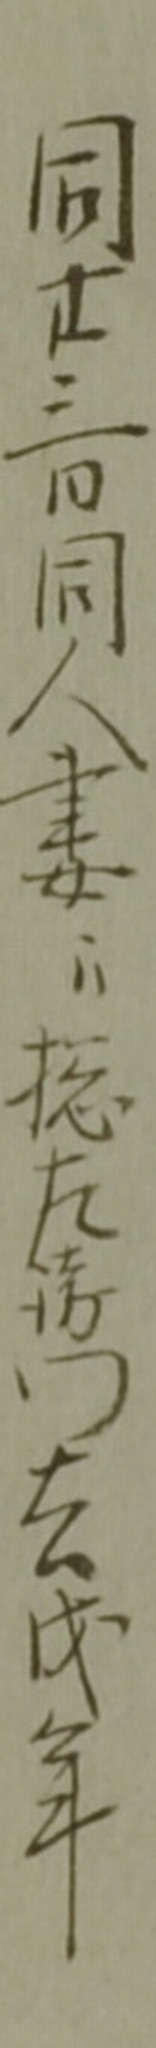同廿三日同人妻江総左衛門去戌年
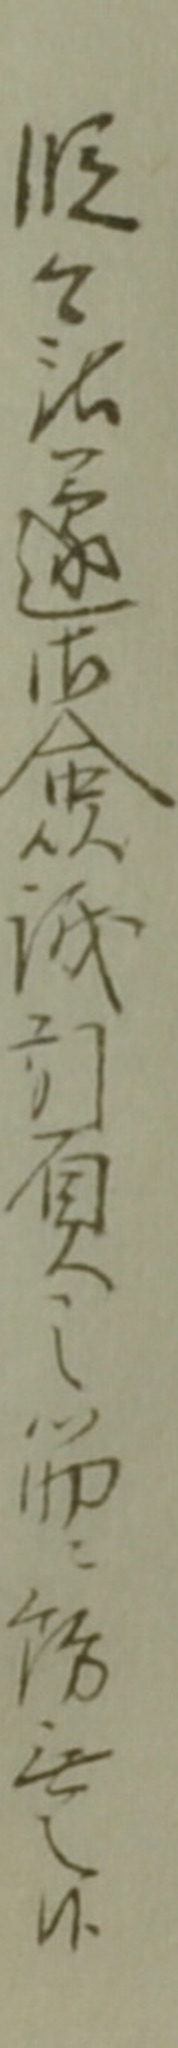段々無遂御僉儀引負之筋無之候
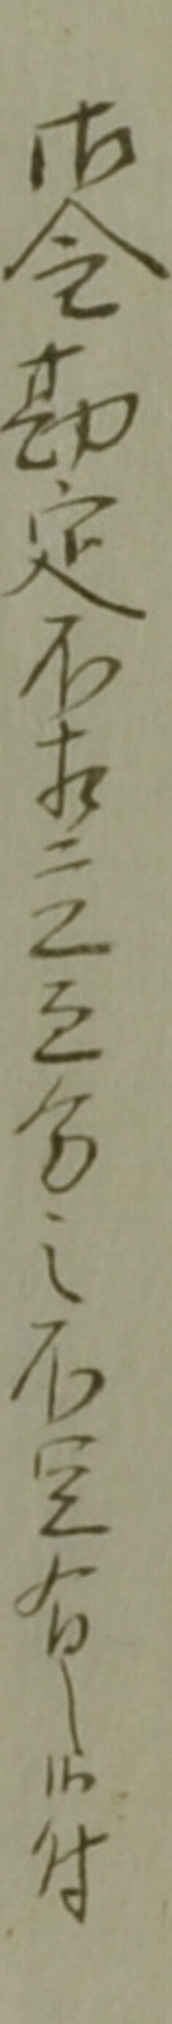御金勘定不相立過分之不足有之候付
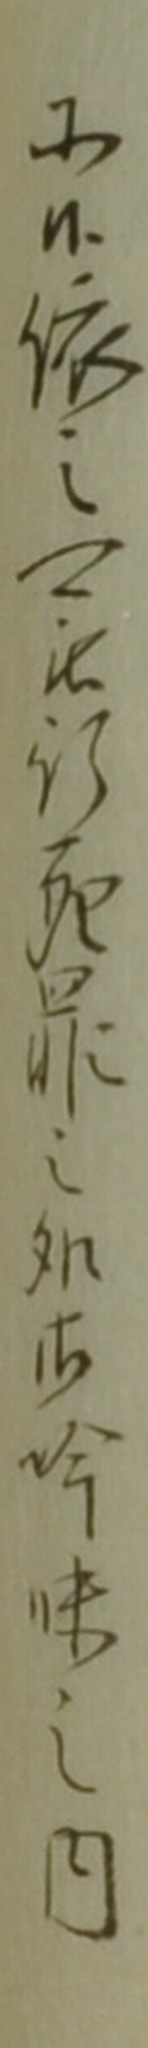に候依之可被行死罪之処御吟味之内
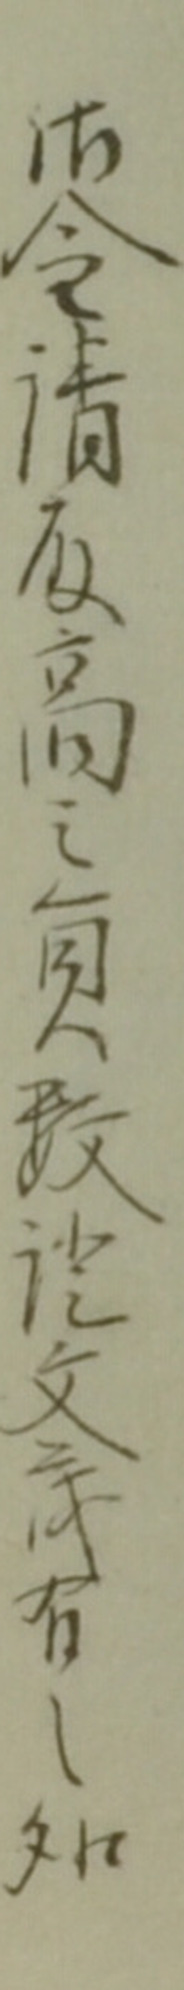御金請取商之員数証文茂有之処
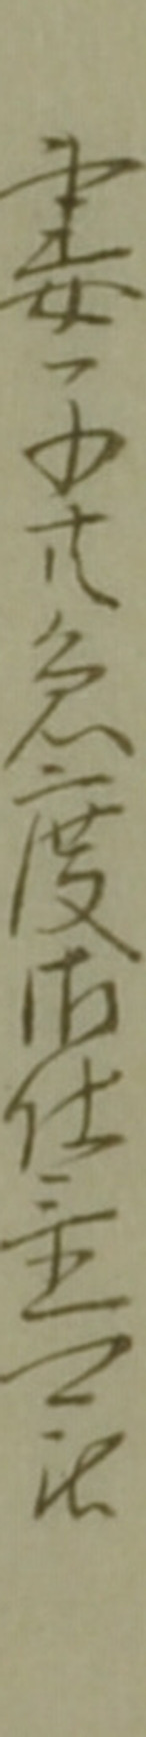妻子共急度御仕置可被
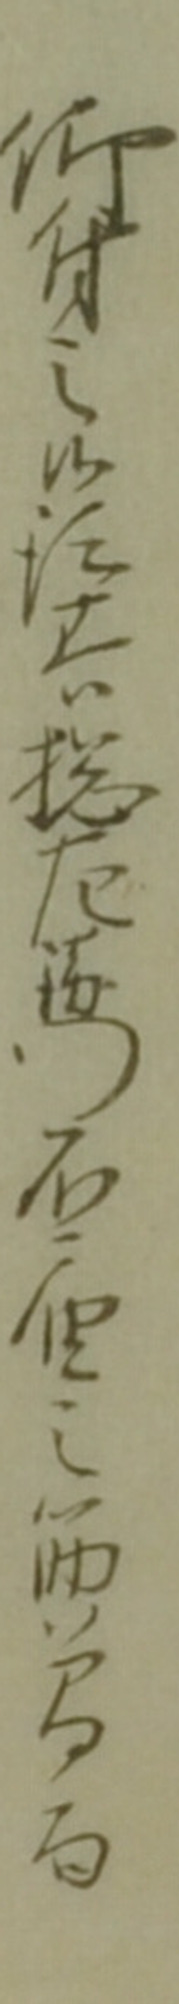仰付之候得共総左衛門不届之筋曽而
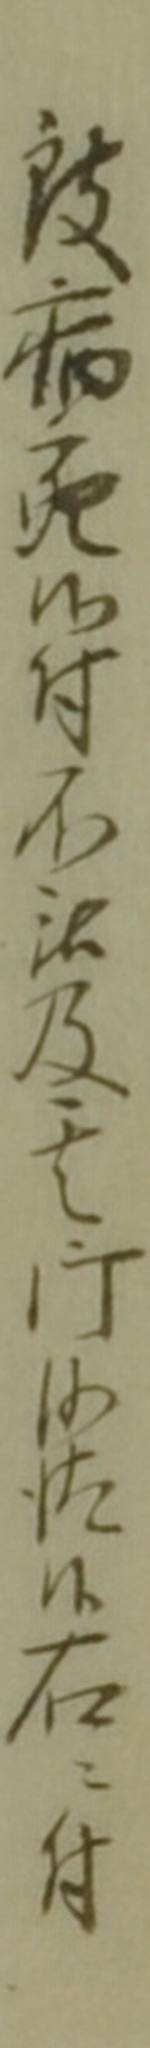致病死候付不被及其御沙汰候右付
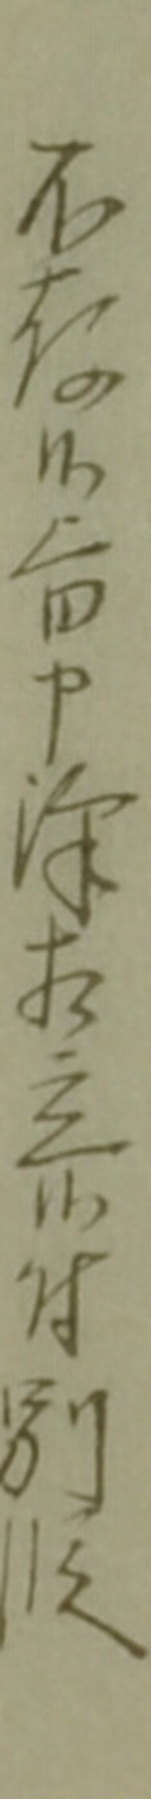不存候旨申沢相立候付別段
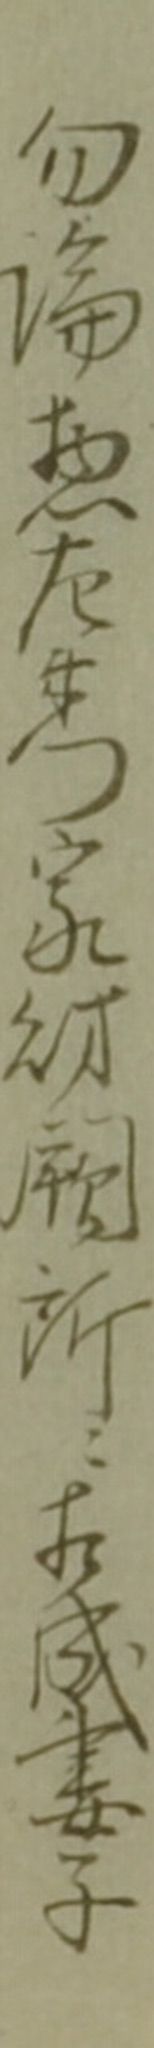勿論惣左衛門家財闕所相成妻子
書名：諸御役代々録（七）
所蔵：伊那市立高遠町図書館・合同会社AMANE
